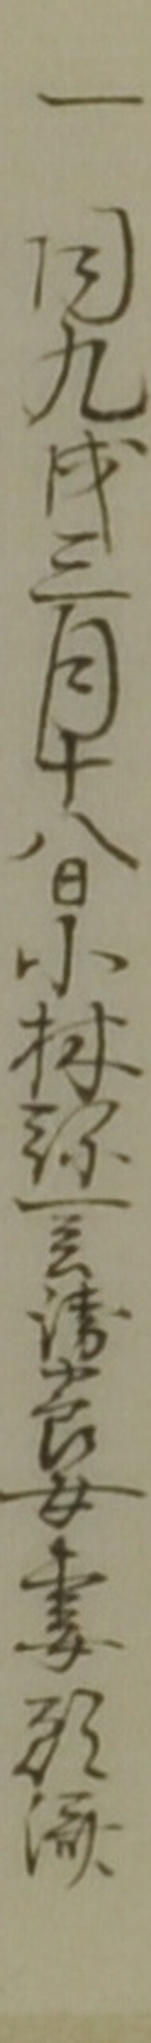一同九戌三月十八日小林弥一兵衛養女妻願済
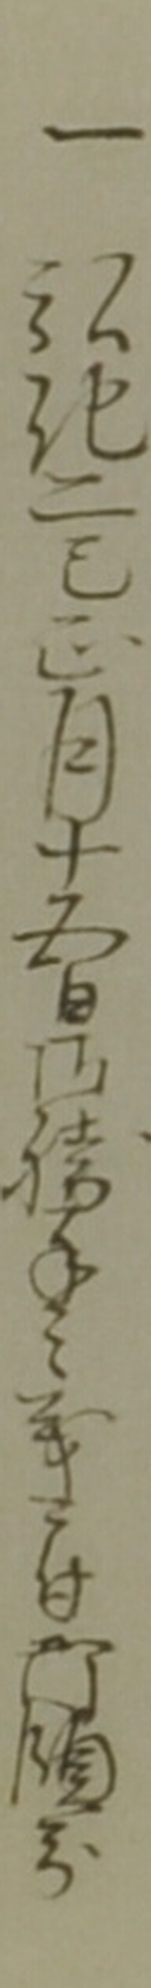一弘化二巳正月十五日御勝手之義二付御領分
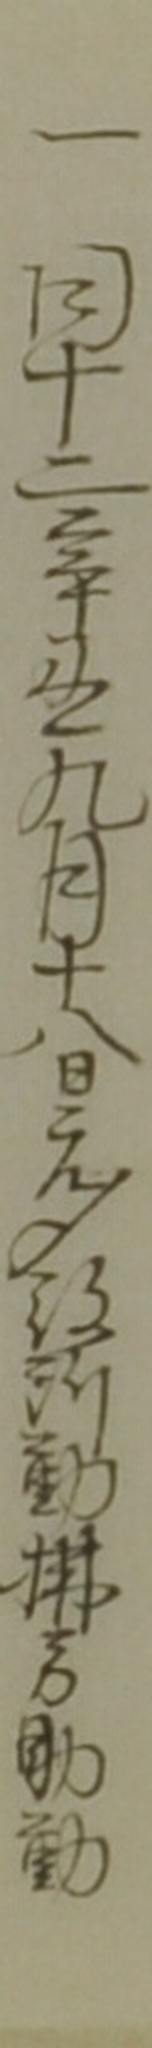一同十二辛丑九月十八日元〆役所勤払方助勤
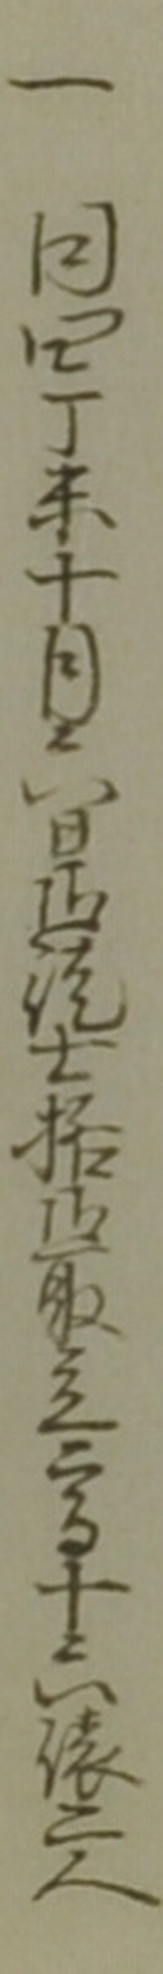一同四丁未十月六日御徒士格御取立高十六俵二人
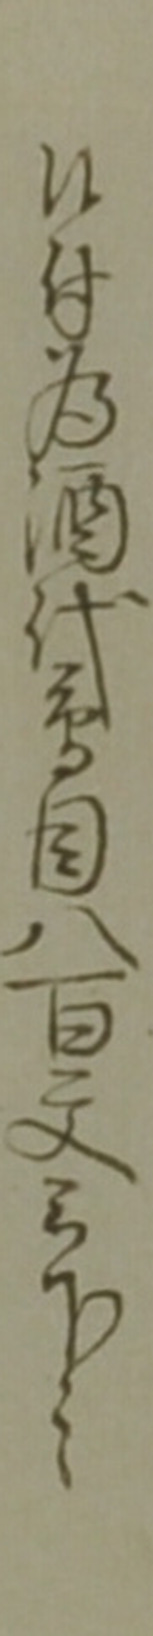候付為酒代鳥目八百文被下之

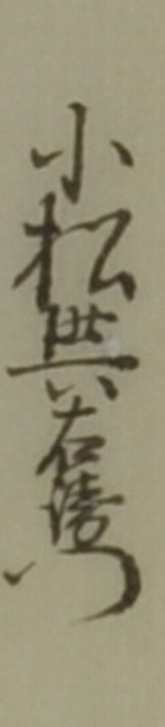小松与右衛門
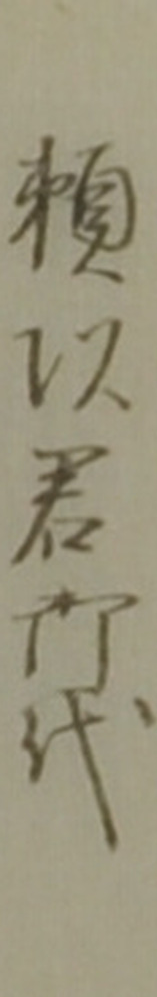頼以君御代
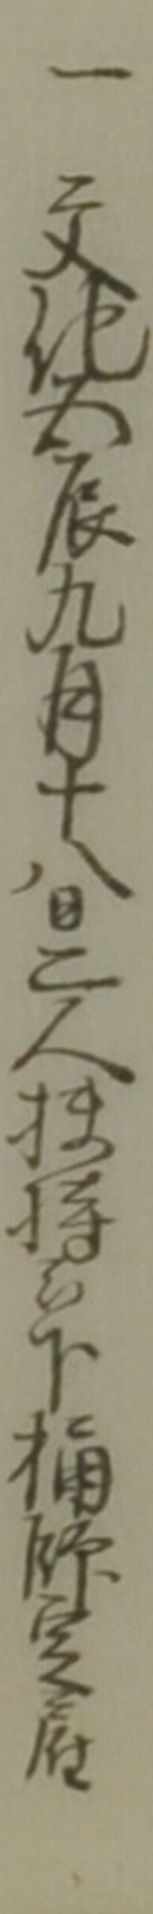一文化五辰九月十八日二人扶持被下桶師定雇
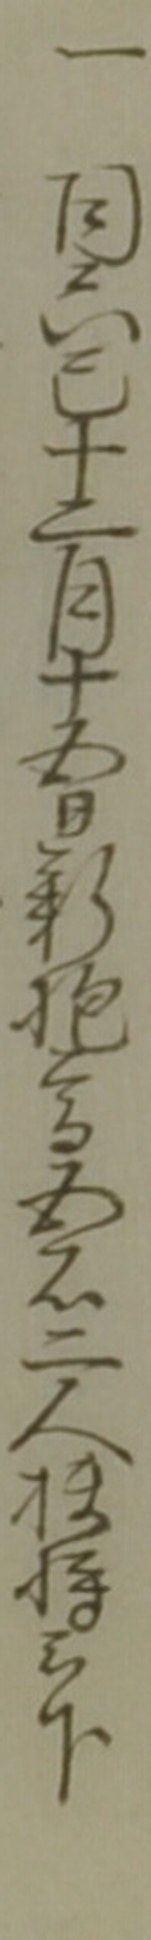一同六巳十二月十五日新抱高五石二人扶持被下
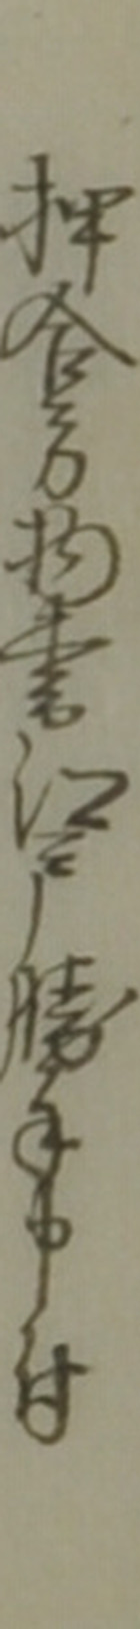押合方物書江戸勝手申付
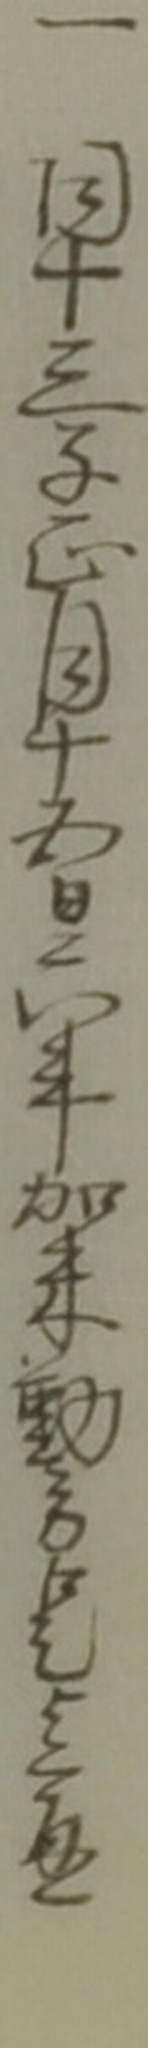一同十三子正月十五日六斗加米勤方是迄通
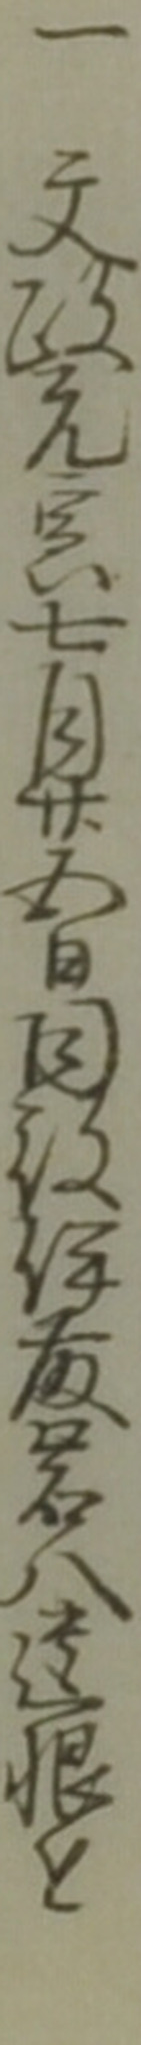一文政元寅七月廿五日同役伊藤岩八遺恨を
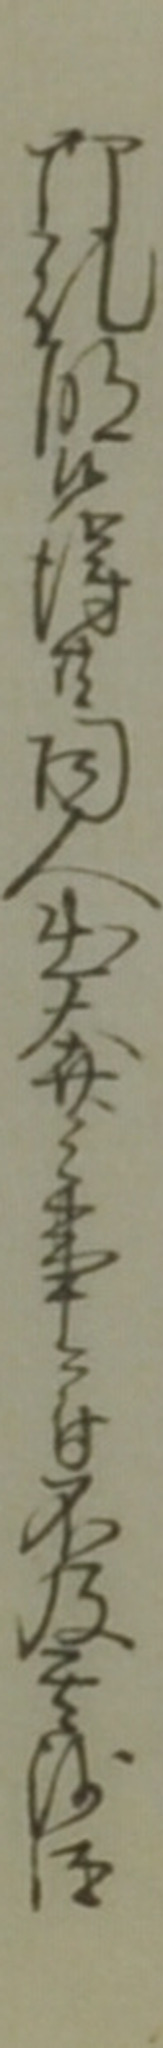御糺明候得共同人出奔之事ニ付不及其沙汰
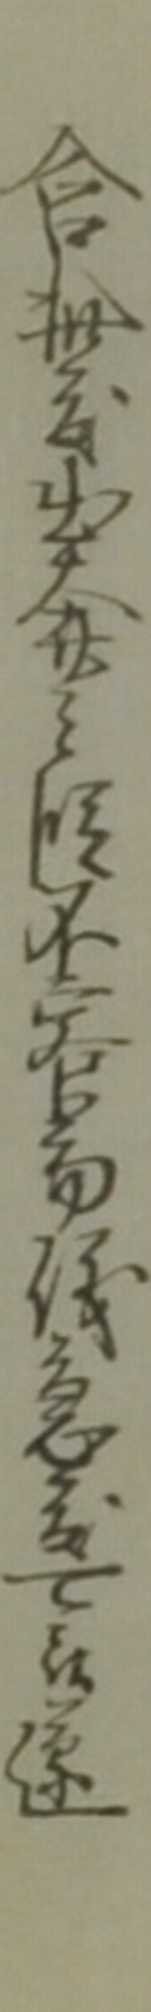含此度出奔之段不容易議儀急度可被遂
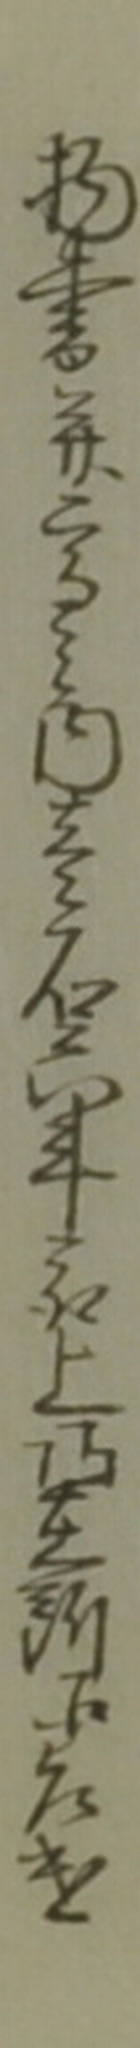物書并高之内壱石六斗取上御在所江差遣
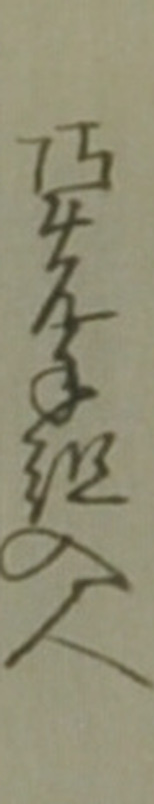御先手組入人
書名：無足諸士勤仕録（八）
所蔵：伊那市立高遠町図書館・合同会社AMANE
